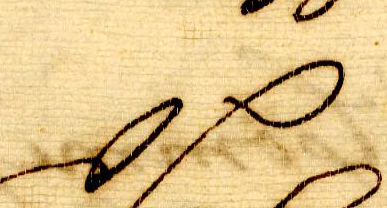To
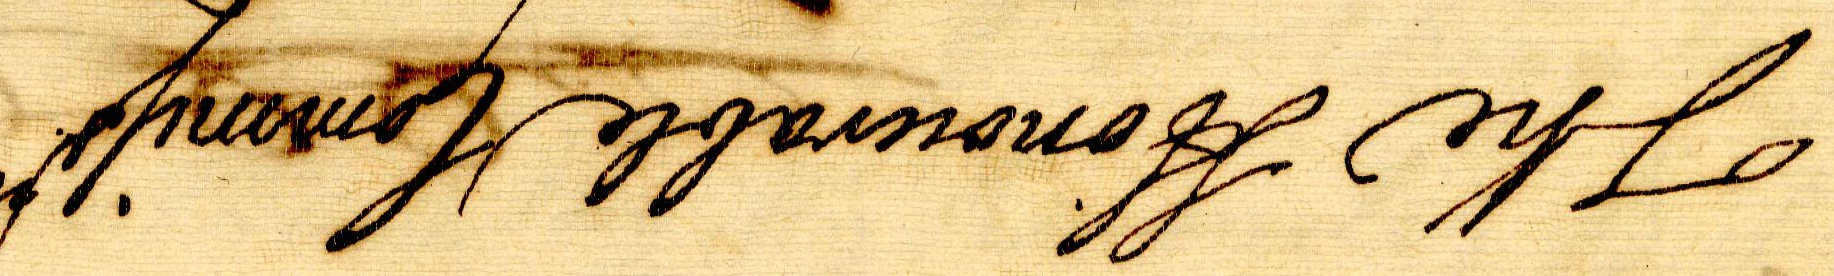The Honourable Commiss^rs
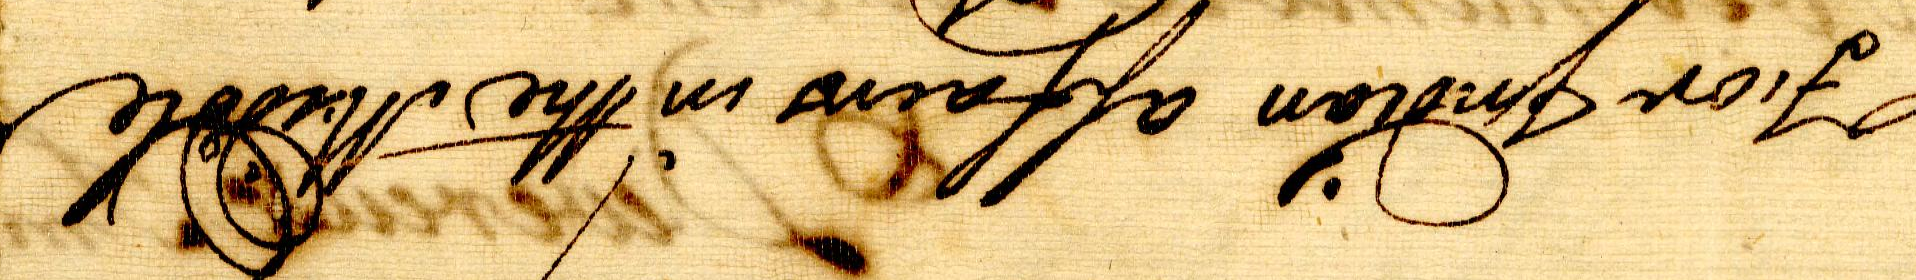For Indian affairs in the Middle
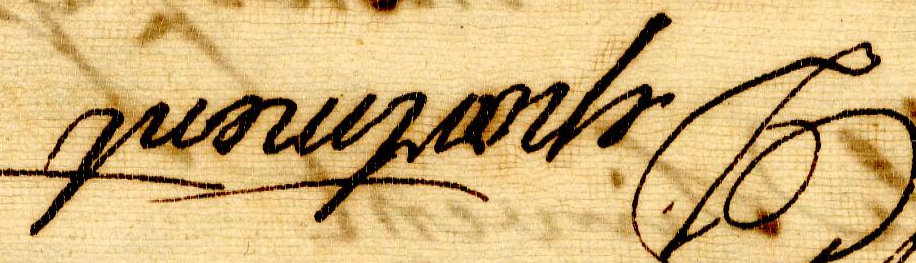Department
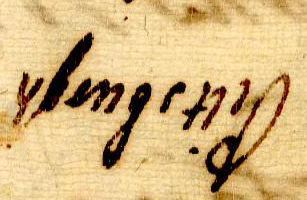Pittsburgh
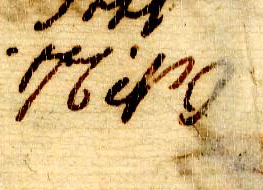Oct^r. 24.
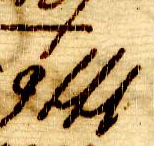1776.
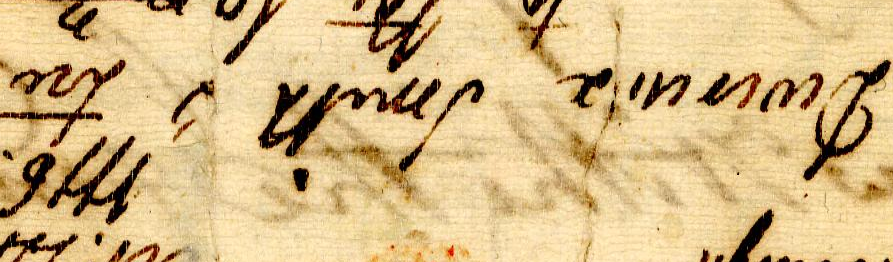Deverux Smith tre
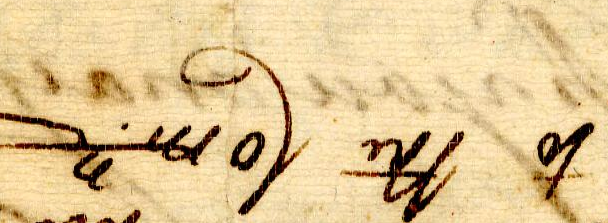to the Com^n.
